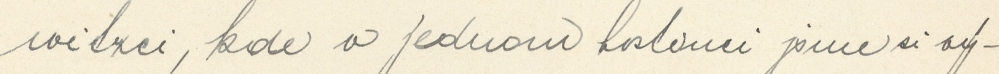witzci, kde v jednom hostinci jsme si vý-
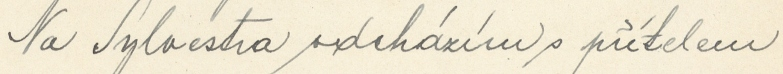Na Sylvestra odcházím s přítelem
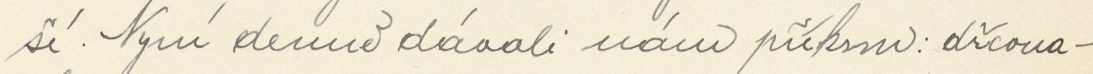ší. Nyní denně dávali nám příkrm: dřevna-
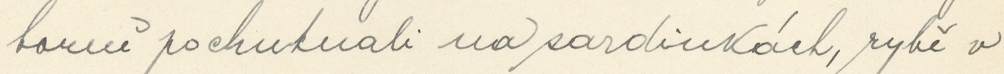borně pochutnali na sardinkách, rybě v
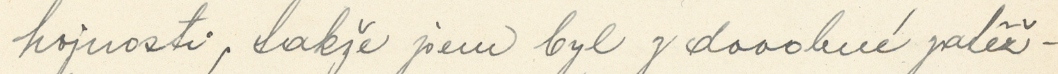hojnosti, takže jsem byl z dovolené zatěž-
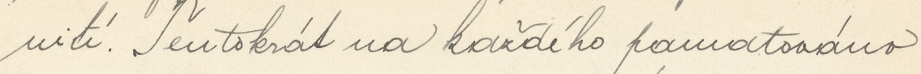nití. Tentokrát na každého pamatováno
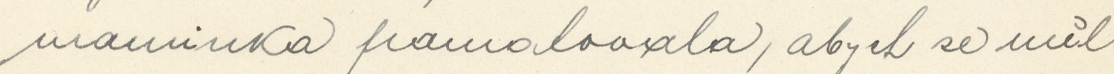maminka pamatovala, abych se měl
